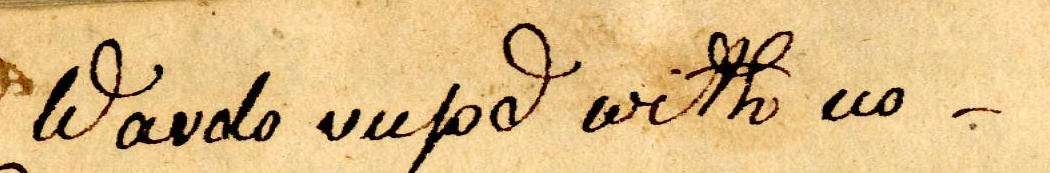Wards sup'd with us-
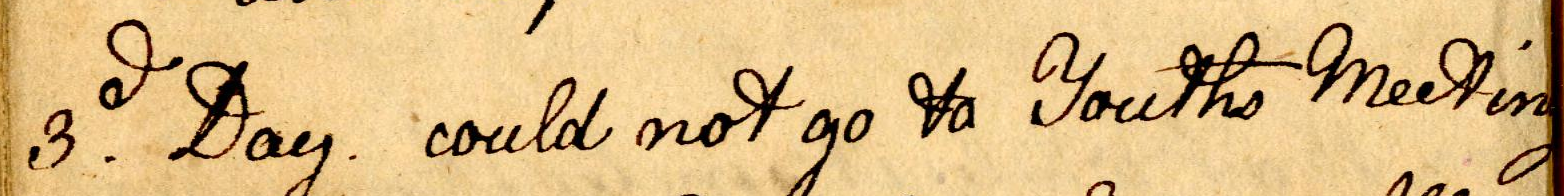3^d. Day. could not go to Youths Meeting
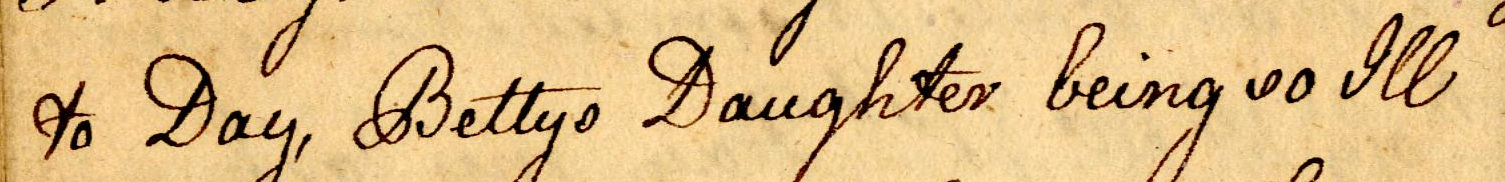to Day, Bettys Daughter being so Ill
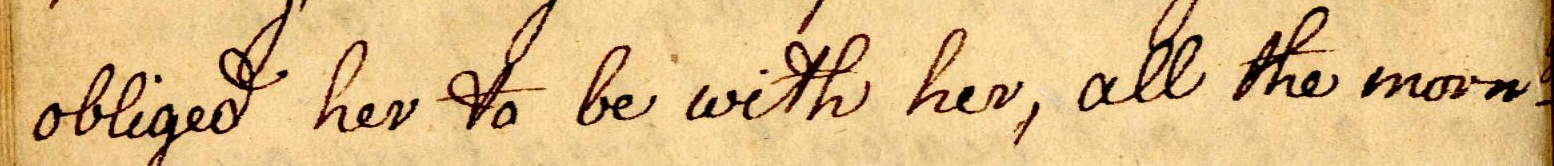obliged her to be with her, all the morn
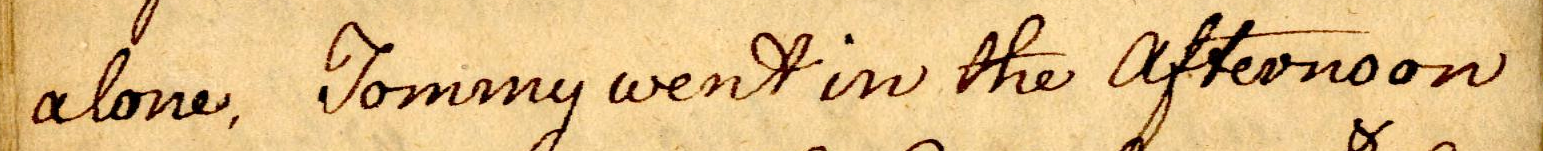alone, Tommy went in the Afternoon
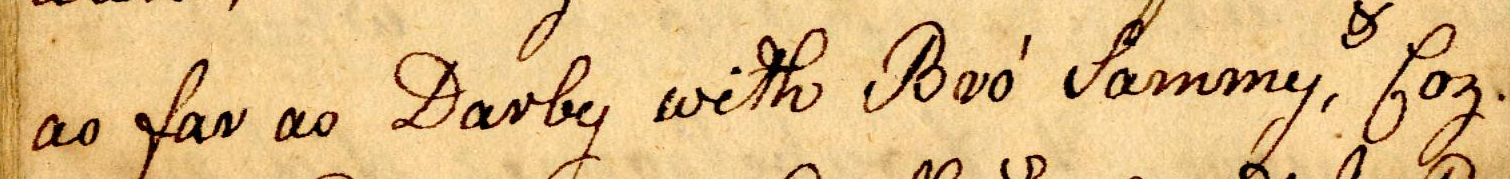as far as Darby with Bro' Sammy, ^& Coz.
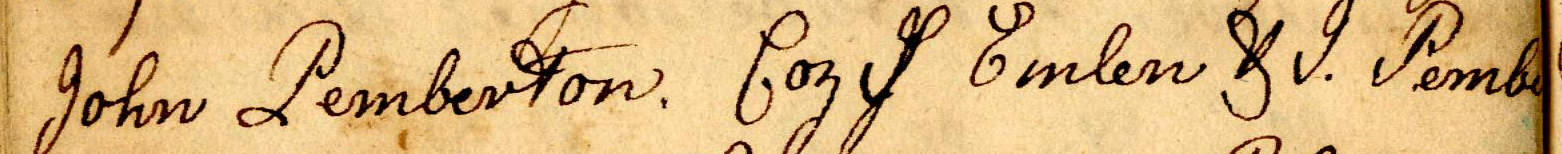John Pemberton, Coz J Emlen & I. Pembe
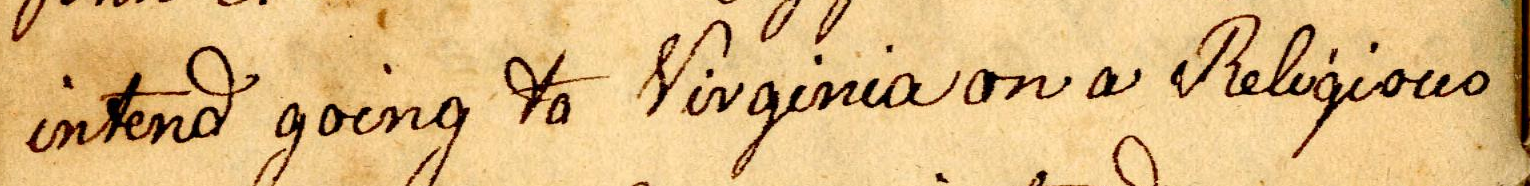intend going to Virginia on a Religious
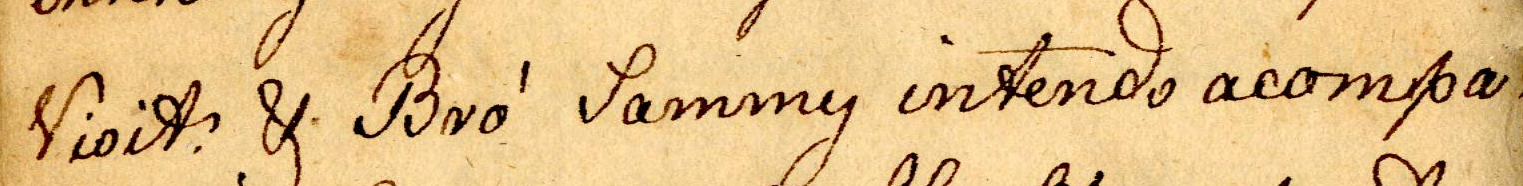Visit. & Bro' Sammy intends acompa
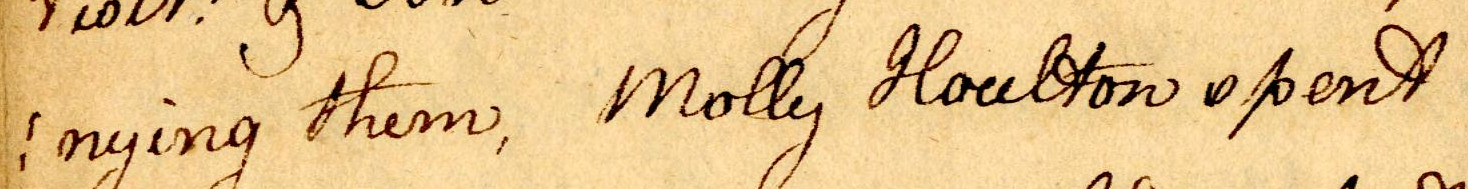-nying them, Molly Houlton spent
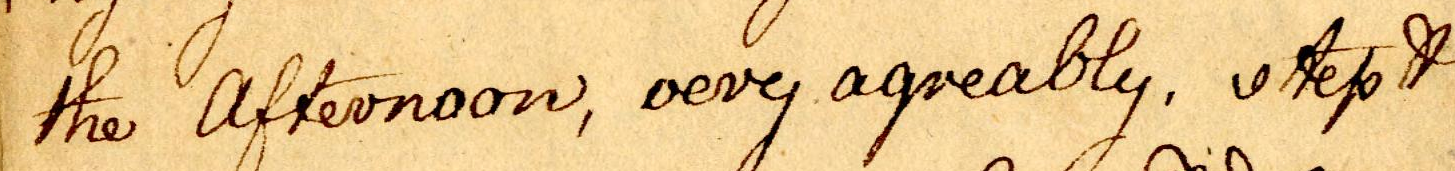the Afternoon, very agreably, stept
